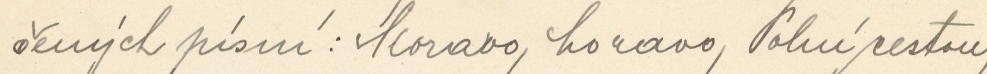čených písní: Moravo, Moravo, Polní cestou,
